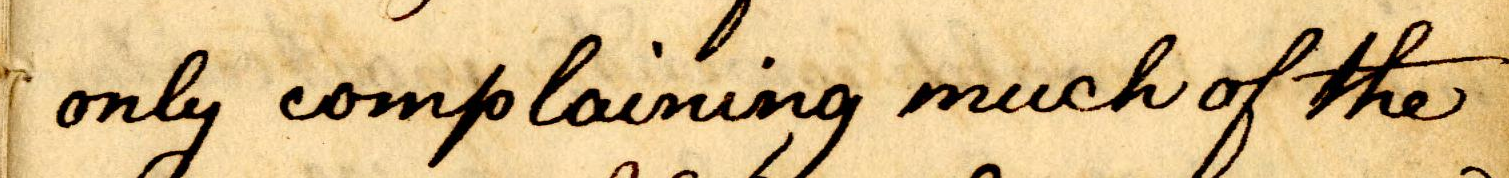only complaining much of the
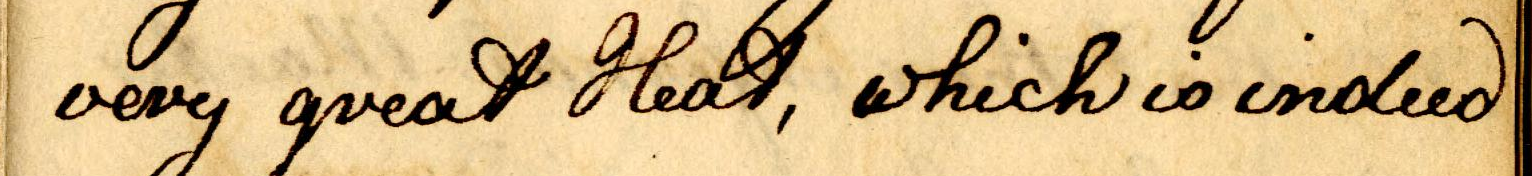very great Heat, which is indeed
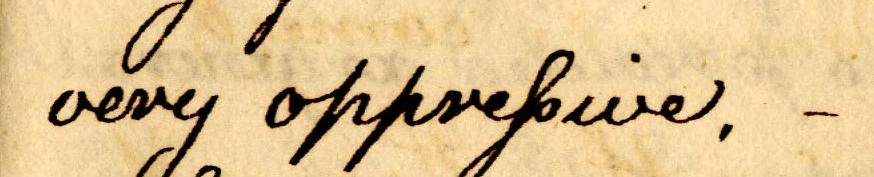very oppressive.-
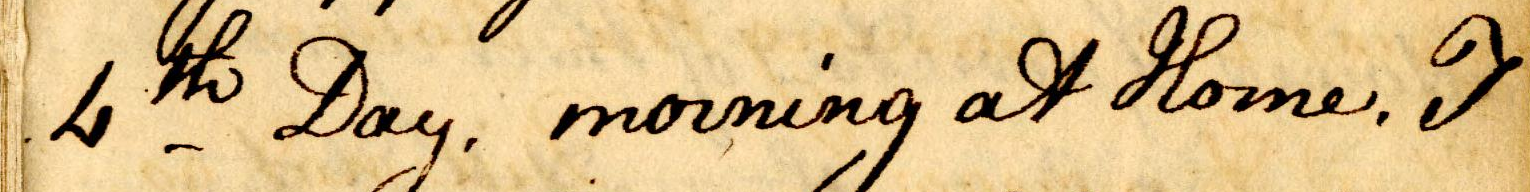4^th Day. morning at Home, T
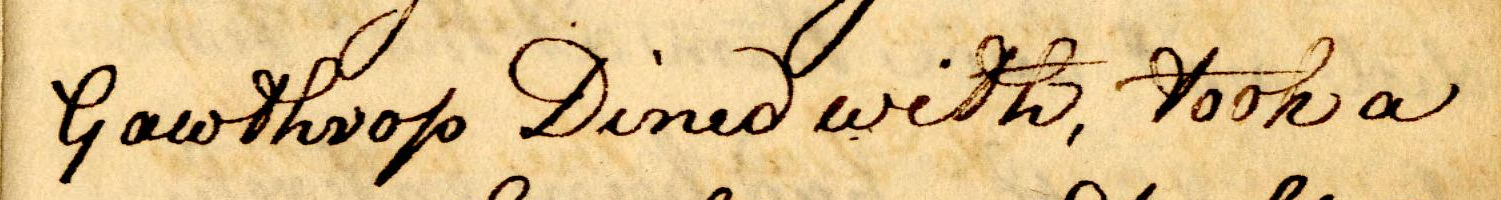Gawthrop Dined with, took a
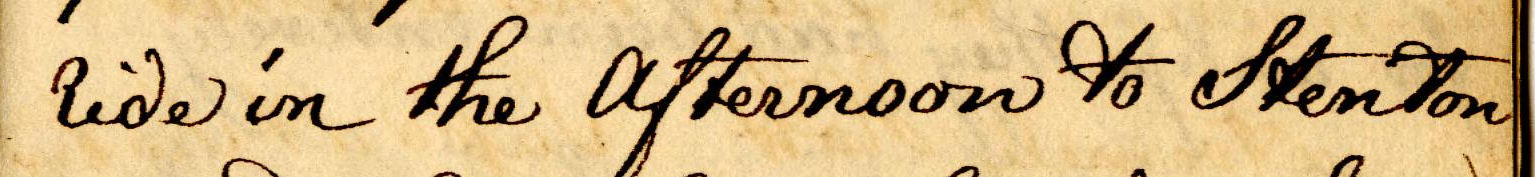ride in the Afternoon to Stenton
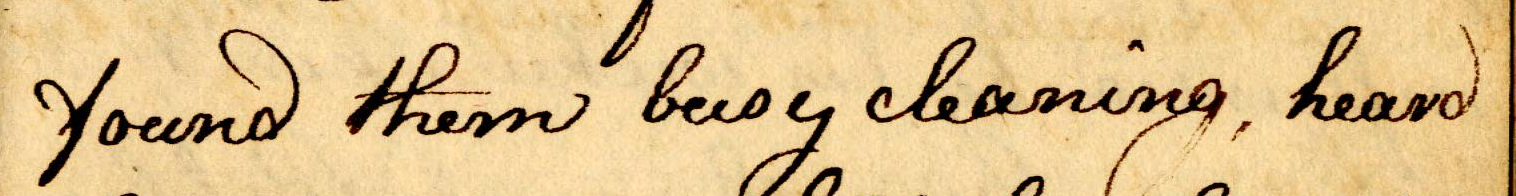found them busy cleaning, heard
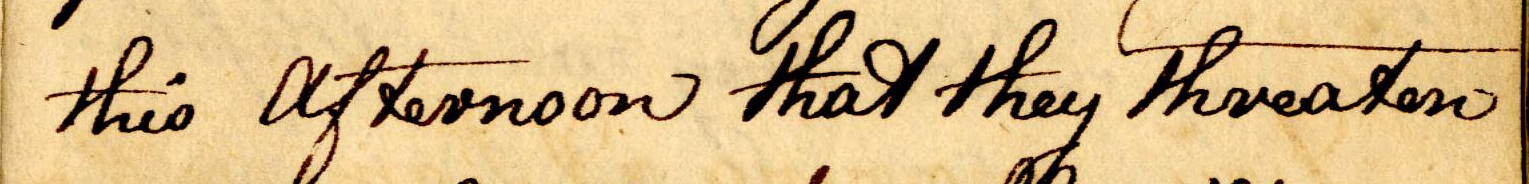this Afternoon that they threaten
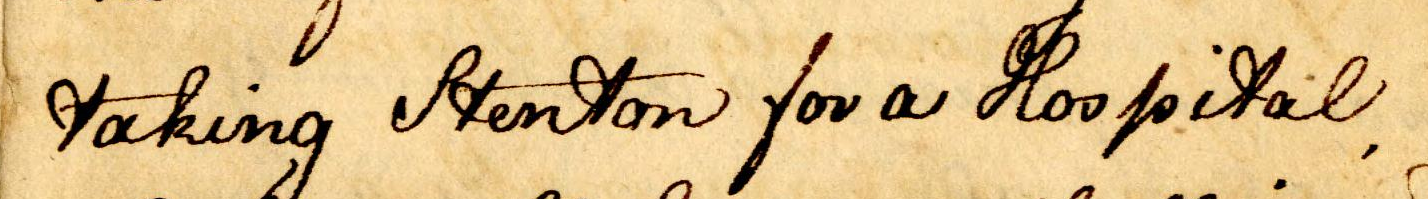taking Stenton for a Hospital,
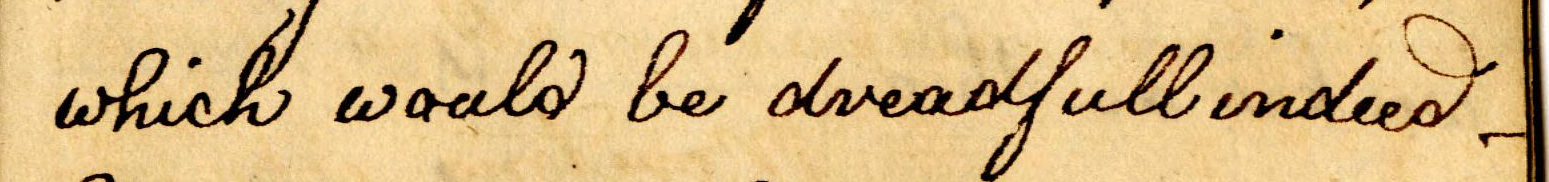which would be dreadfull indeed-
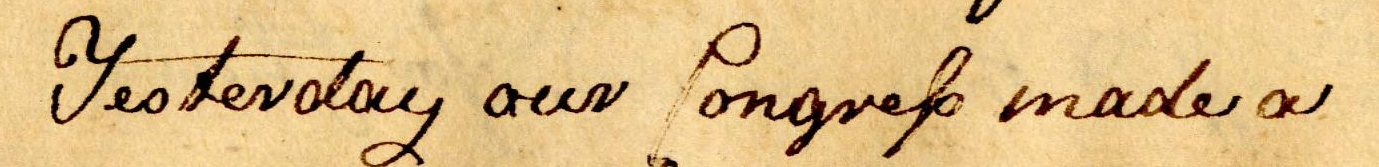Yesterday our Congress made a
